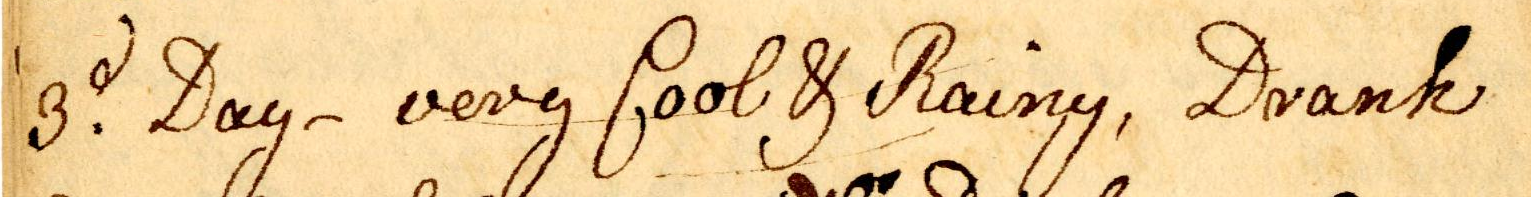3^d. Day- very Cool & Rainy, Drank
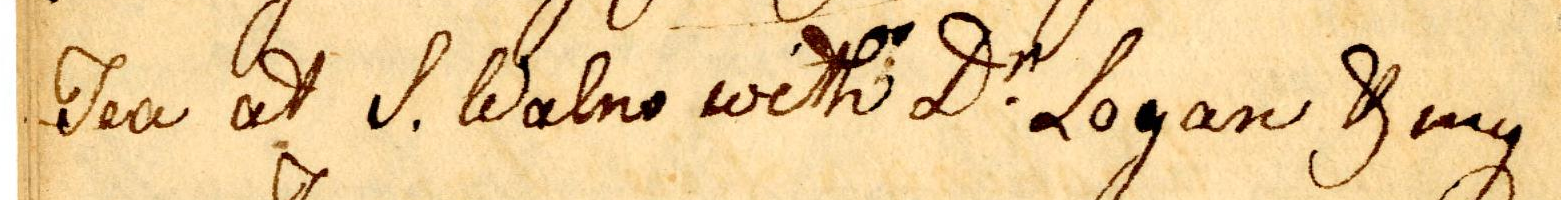Tea at S. Walns with D^r. Logan & my
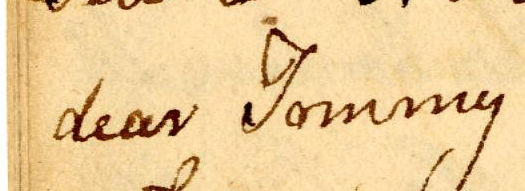dear Tommy
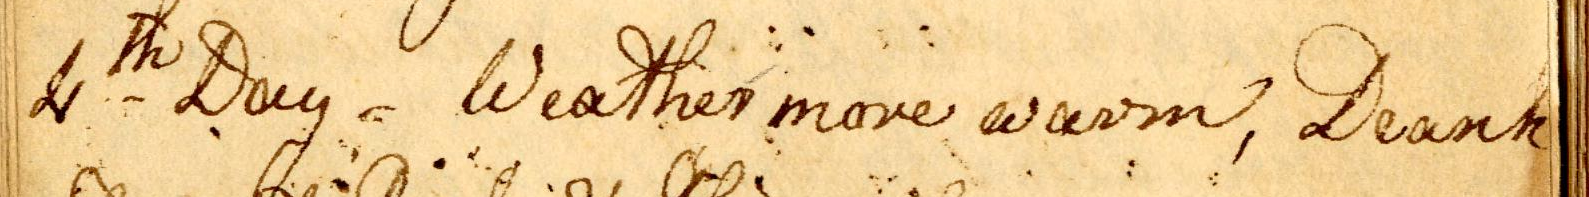4^th Day- Weather more warm, Drank
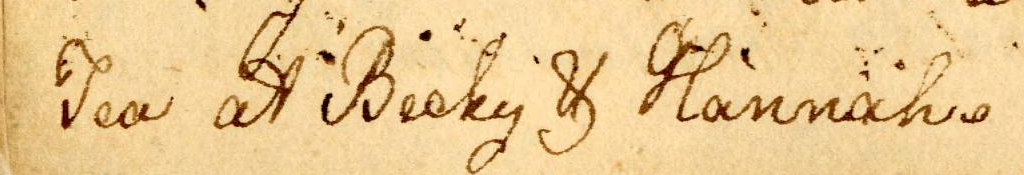Tea at Becky & Hannahs
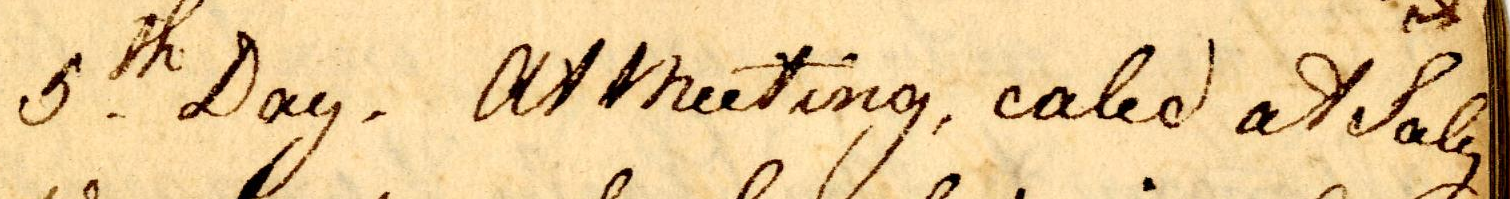5^th Day- At Meeting, caled at Saly
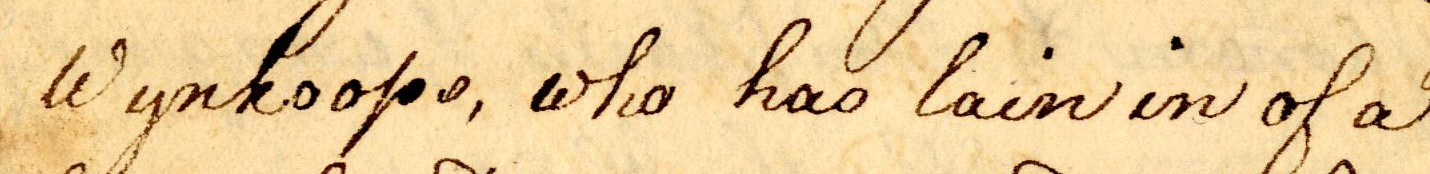Wynkoops, who has lain in of a
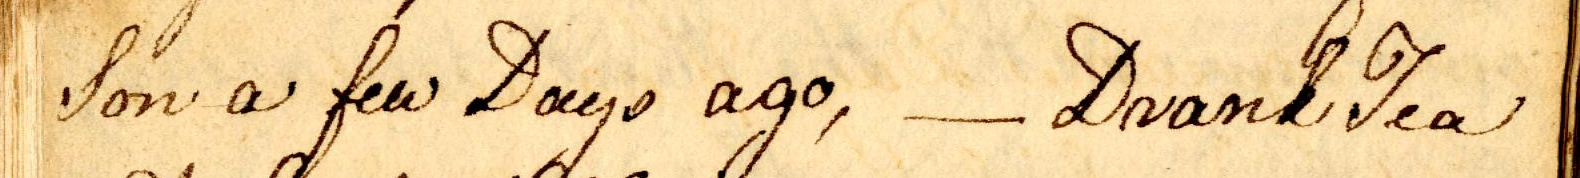Son a few Days ago, - Drank Tea
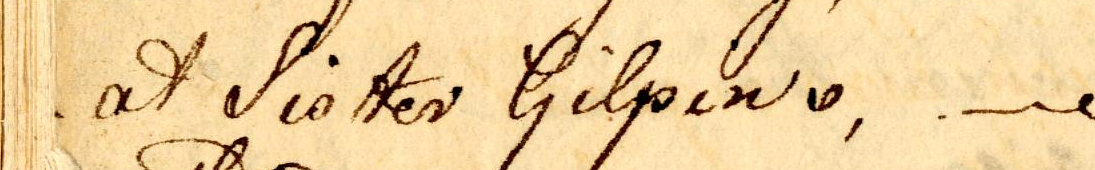at Sister Gilpins, -
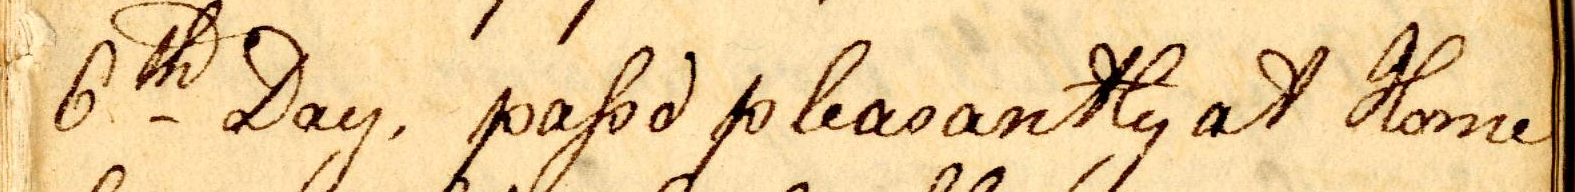6^th Day, passd pleasantly at Home
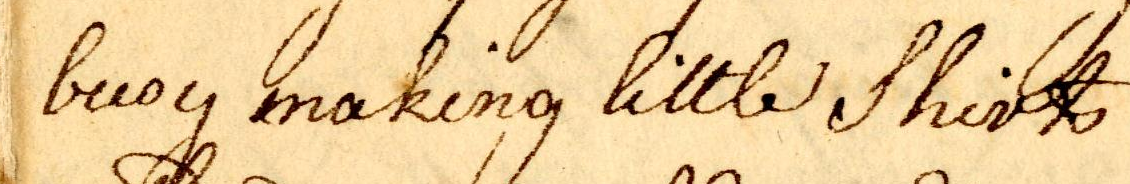busy making little Shirts
